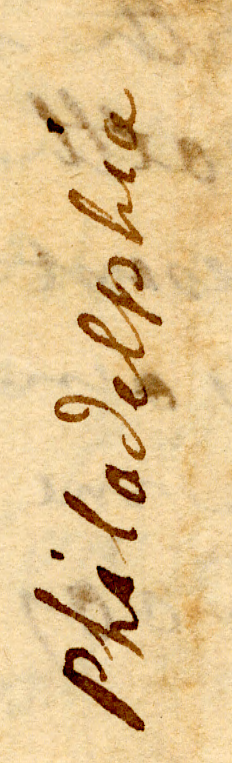Philadelphia
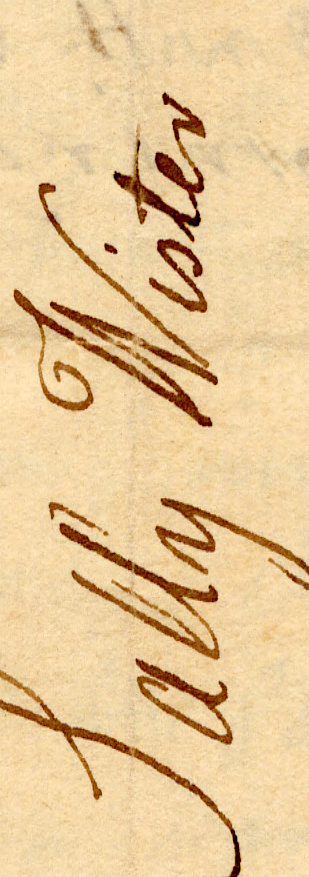Sally Wister
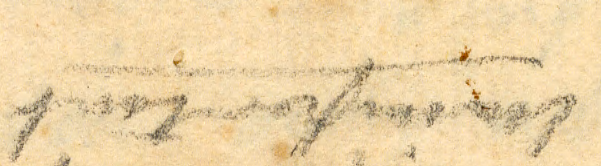unimportant
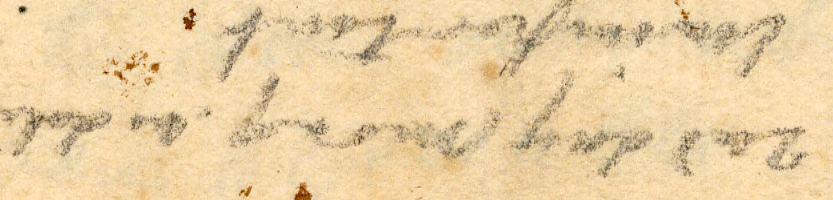2nd day morg. no date
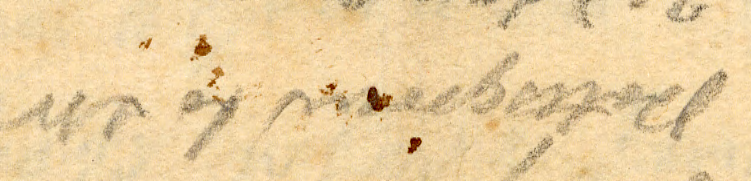Pottsgrove to SW
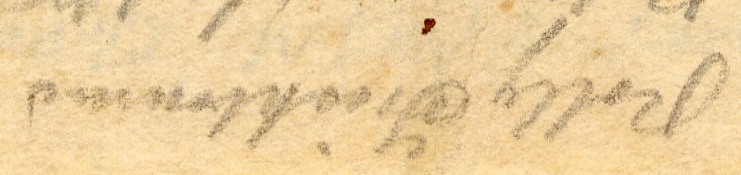Polly Fishbourne
